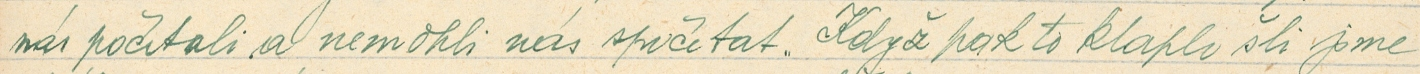nás počítali a nemohli nás spočítat.. Když pak to klaplo šli jsme
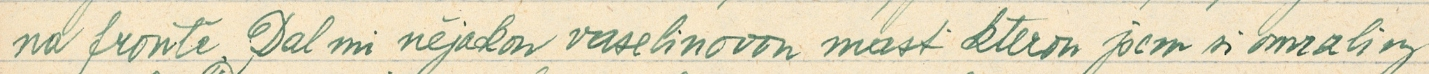na frontě. Dal mi nějakou vaselinovou masť kterou jsem si omrzliny
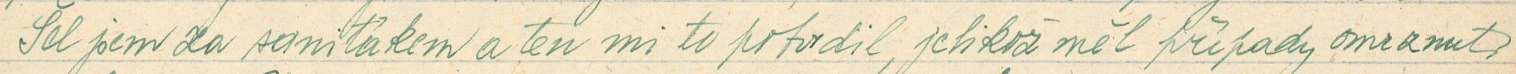Šel jsem za saniťákem a ten mi to potvrdil, jelikož měl případy omrznutí
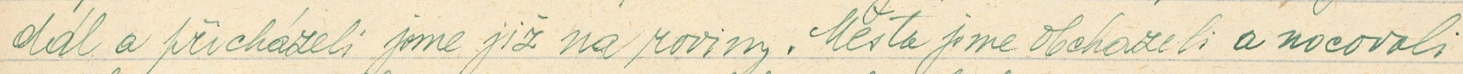dál a přicházeli jsme již na roviny. Města jsme obchazeli a nocovali
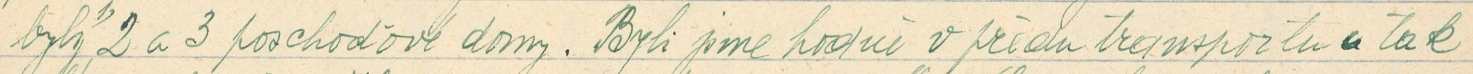byly 1, 2 a 3 poschoďové domy. Byli jsme hodně v předu transportu a tak
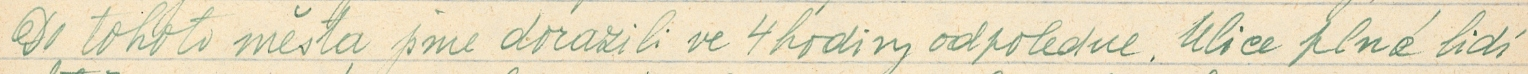Do tohoto města jsme dorazili ve 4 hodiny odpoledne. Ulice plná lidí
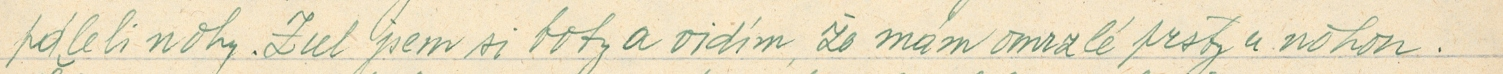páleli nohy. Zul jsem si boty a vidím, že mám omrzlé prsty u nohou.
